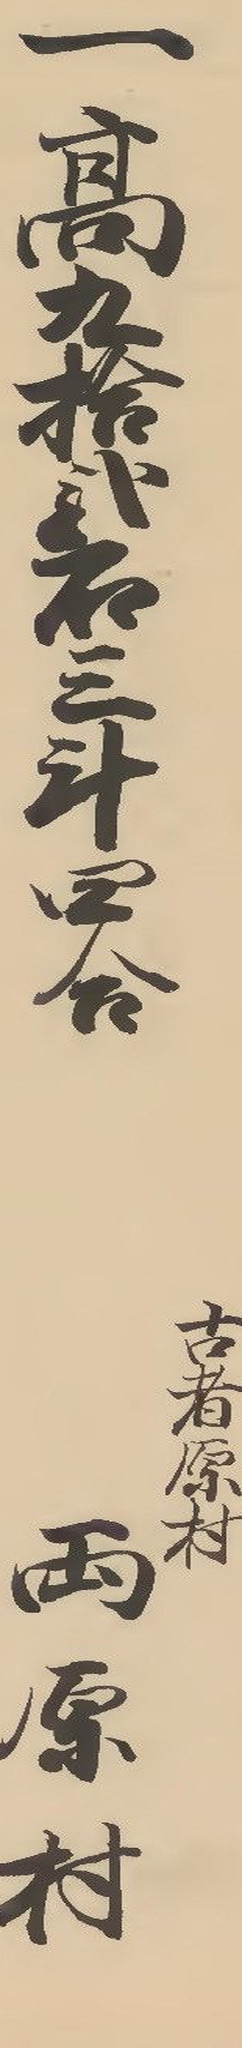一高九拾弐石三斗四合西原村
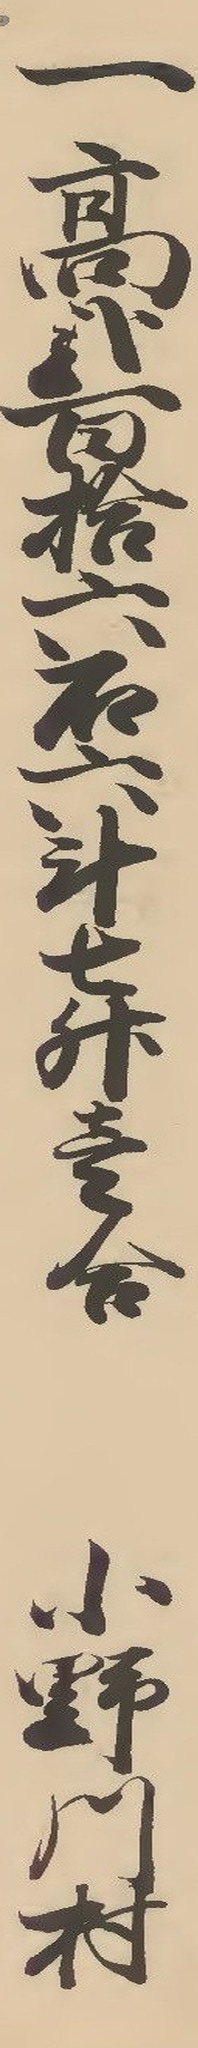一高弐百拾六石六斗七升壱合小野川村
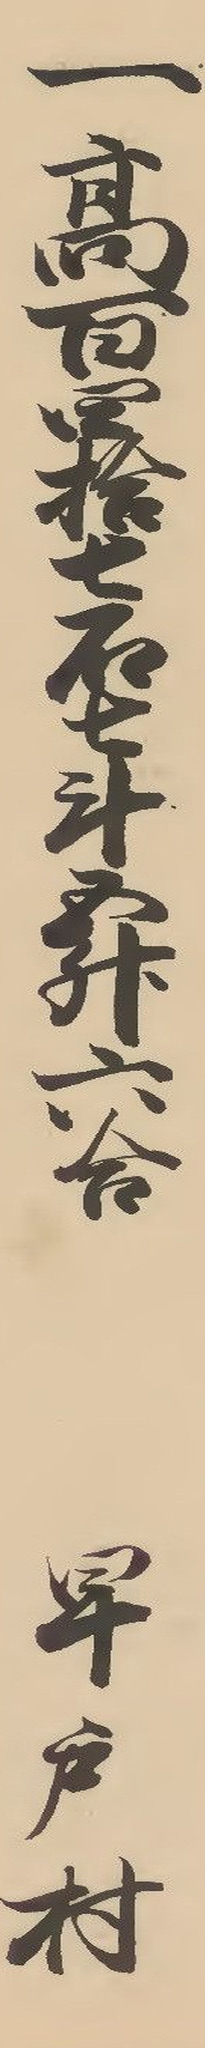一高百四拾七石七斗五升六合早戸村
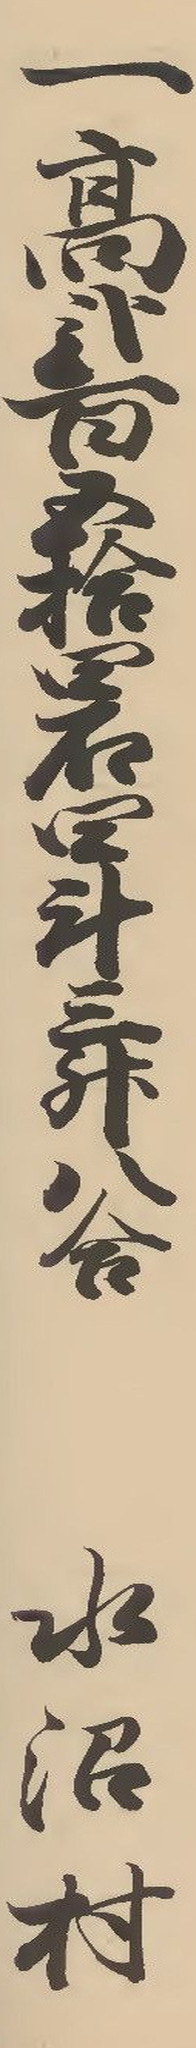一高弐百五拾四石四斗三升八合水沼村
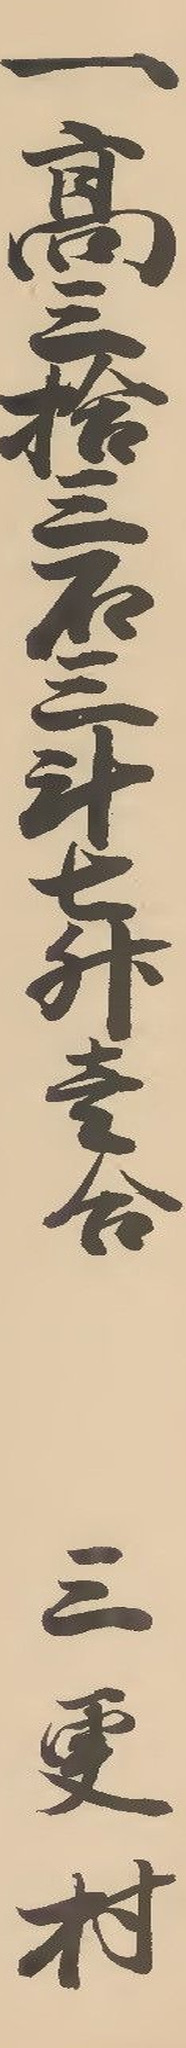一高三拾三石三斗七升壱合三更村
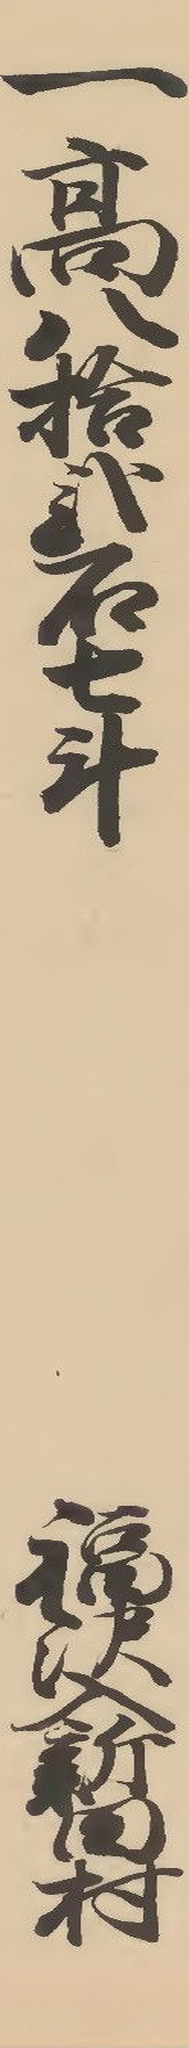一高八拾弐石七斗福沢入新田村
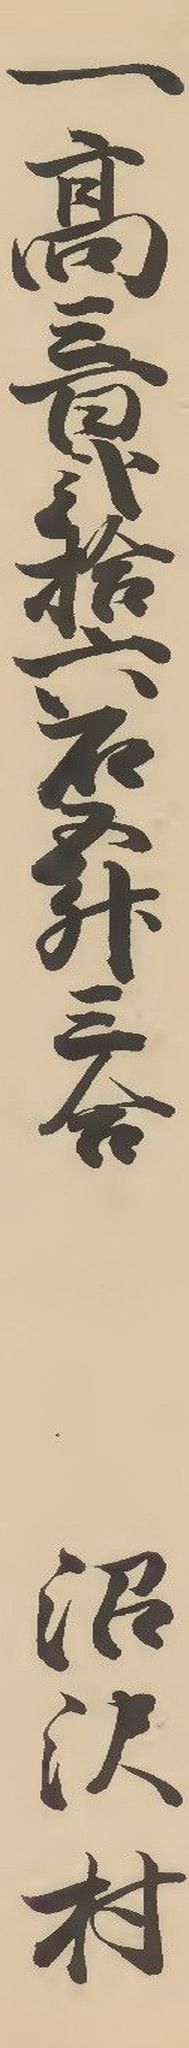一高三百弐拾六石五升三合沼沢村
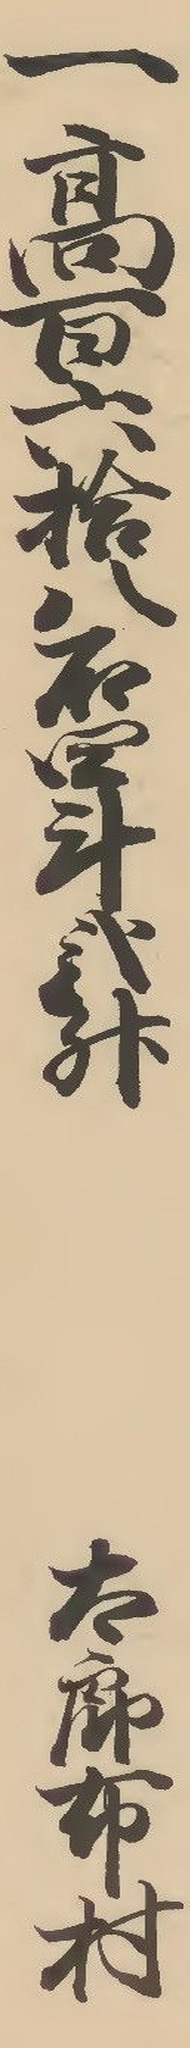一高百六拾八石四斗弐升太郎布村

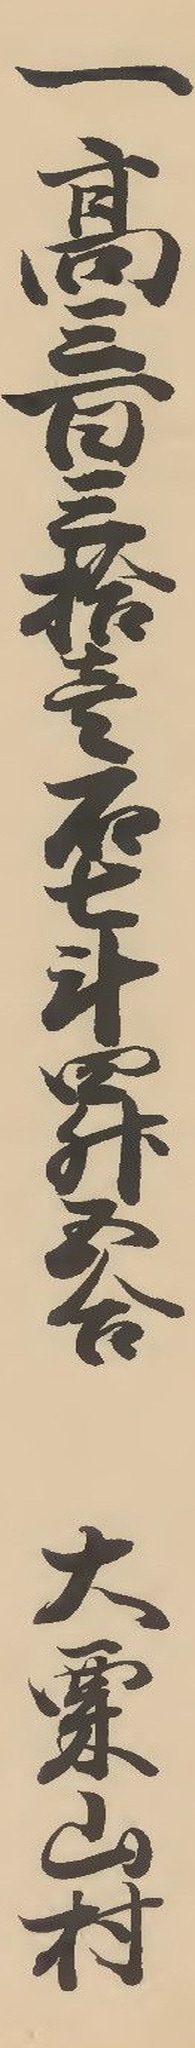一高三百三拾壱石七斗四升五合大栗山村
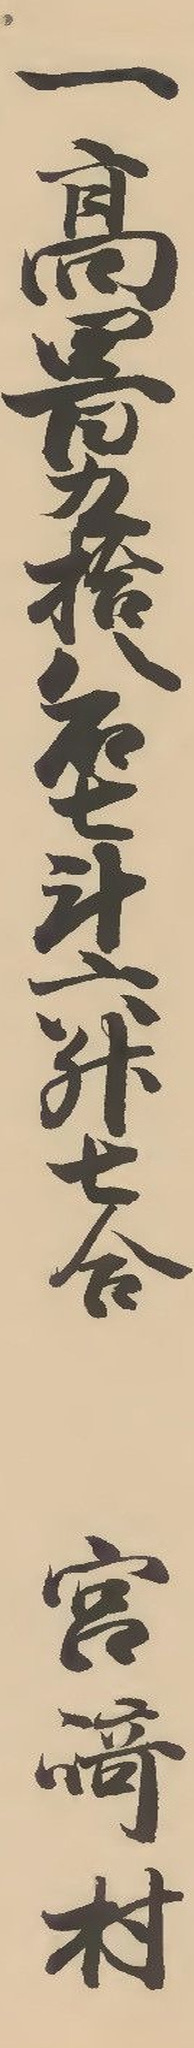一高四百九拾八石七斗六升七合宮崎村
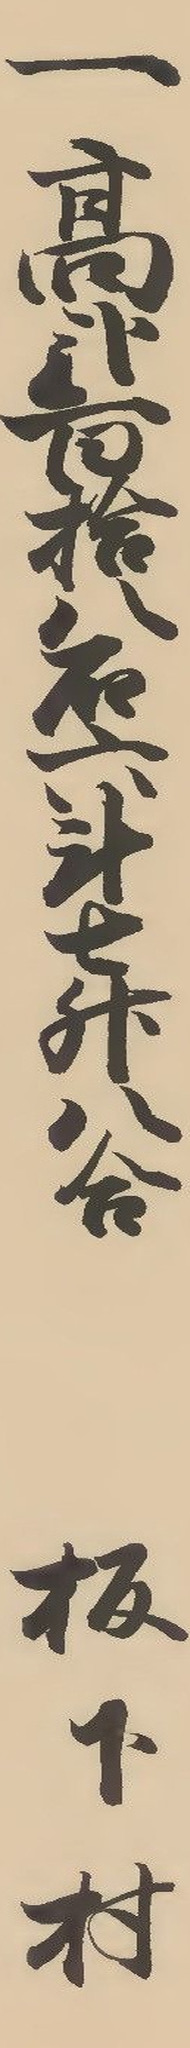一高弐百拾八石六斗七升八合板下村
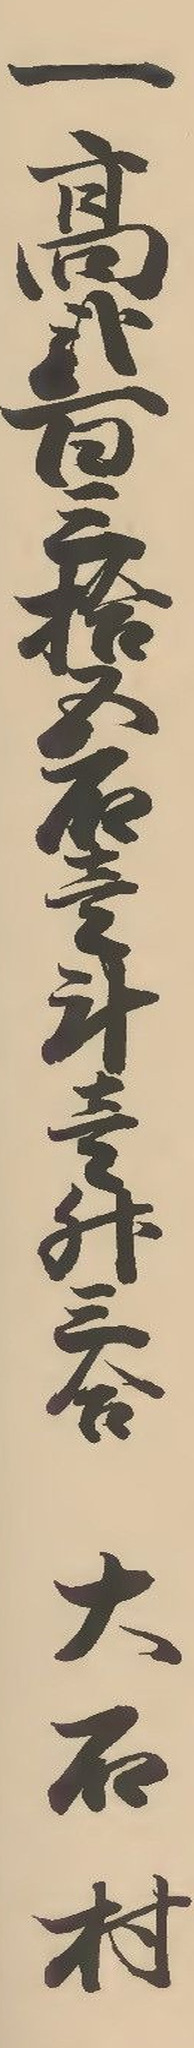一高弐百三拾五石壱斗壱升三合大石村
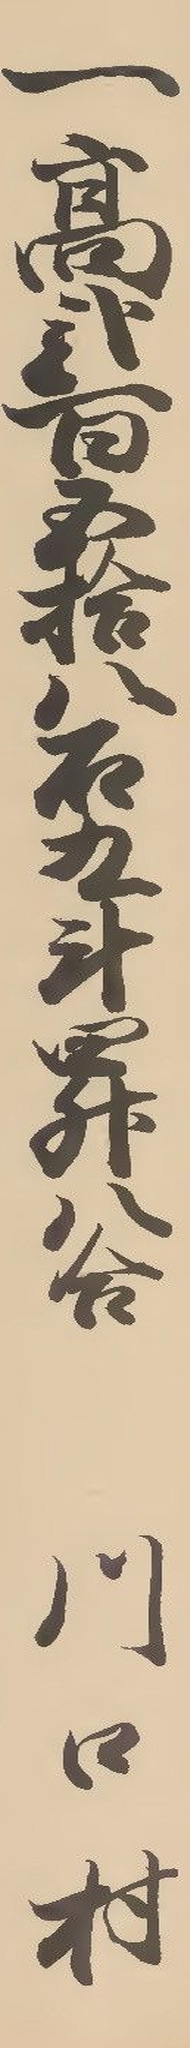一高弐百五拾八石九斗四升八合川口村
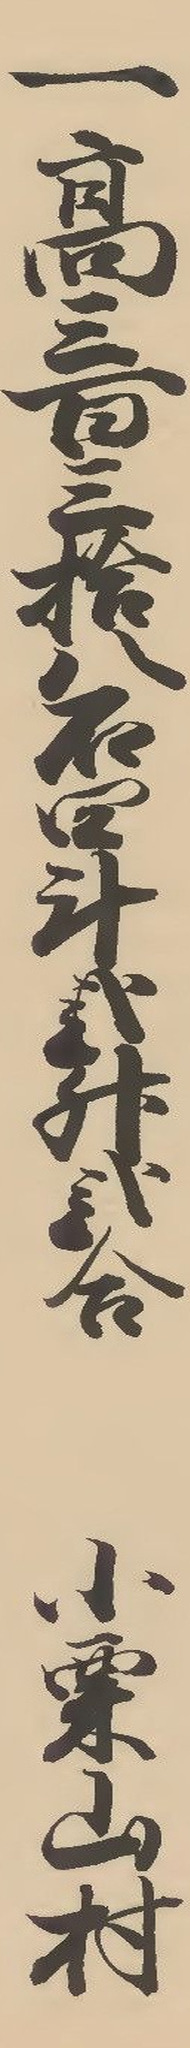一高三百三拾八石四斗弐升弐合小栗山村
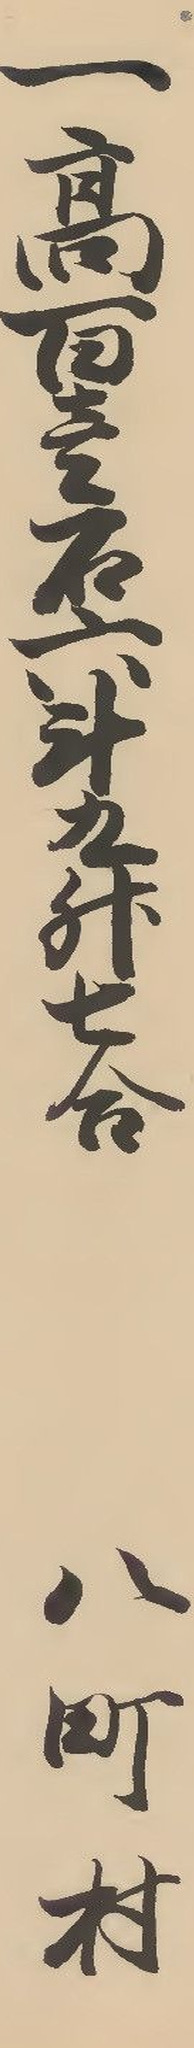一高百壱石六斗九升七合八町村
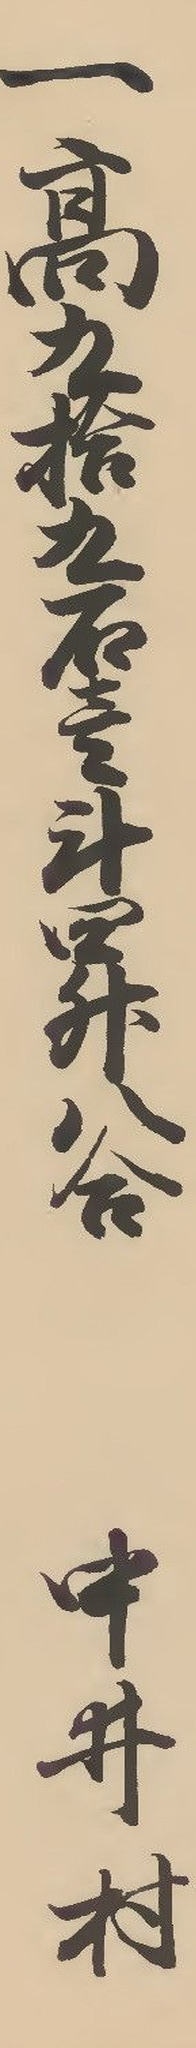一高九拾九石壱斗四升八合中井村
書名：陸奥国郷帳　１
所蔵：国立公文書館 National Archives of Japan
